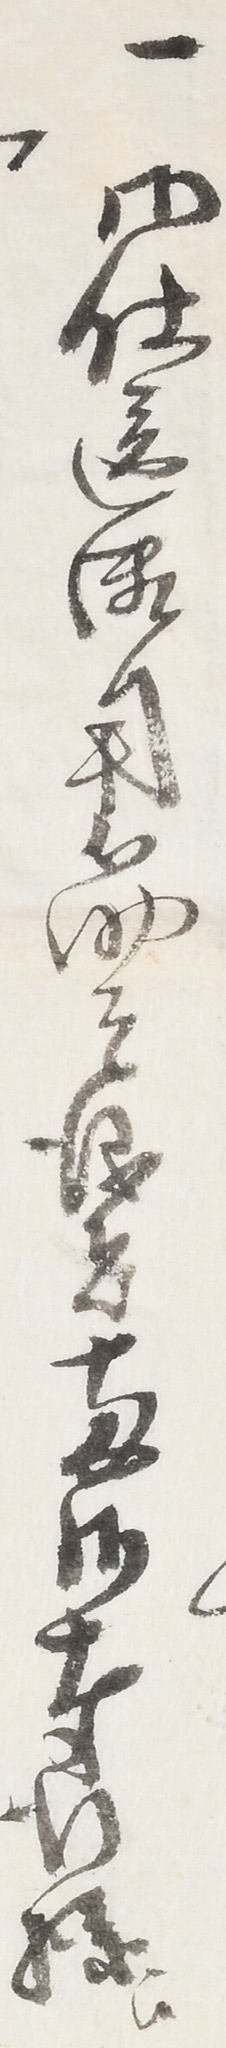一御仕送御用筋之儀者両御奉行様江
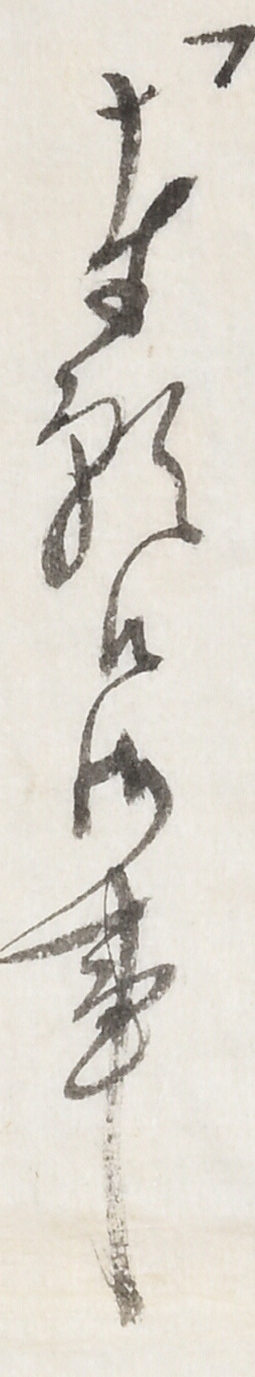奉願候御事
